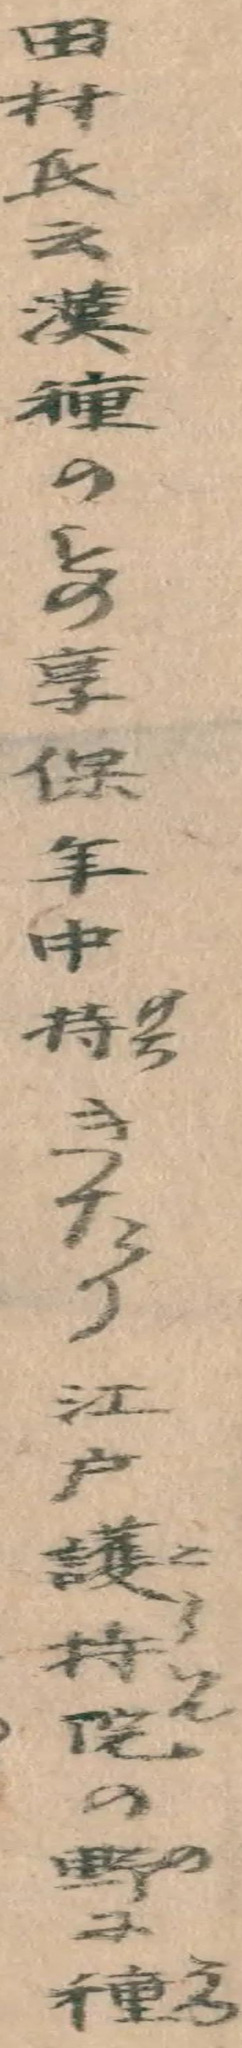田村氏云漢種のもの享保年中持きたり江戸護持院の野に種
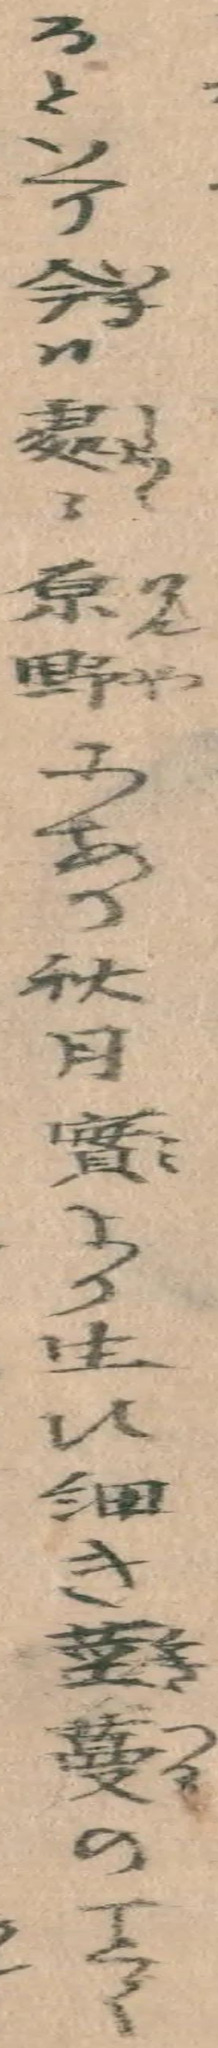るといへり今は処々原野にあり秋月実より生す細き茎蔓のことく
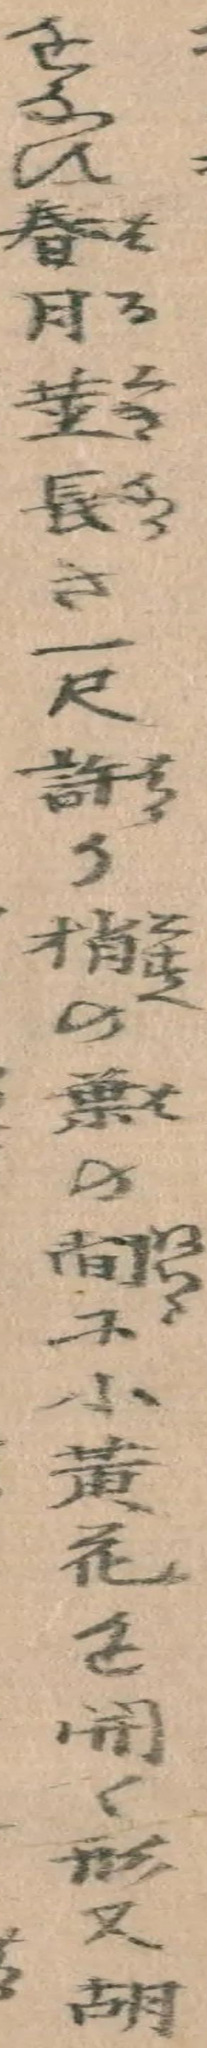をなす春月茎長さ一尺許り梢の葉の間に小黄花を開く形又胡
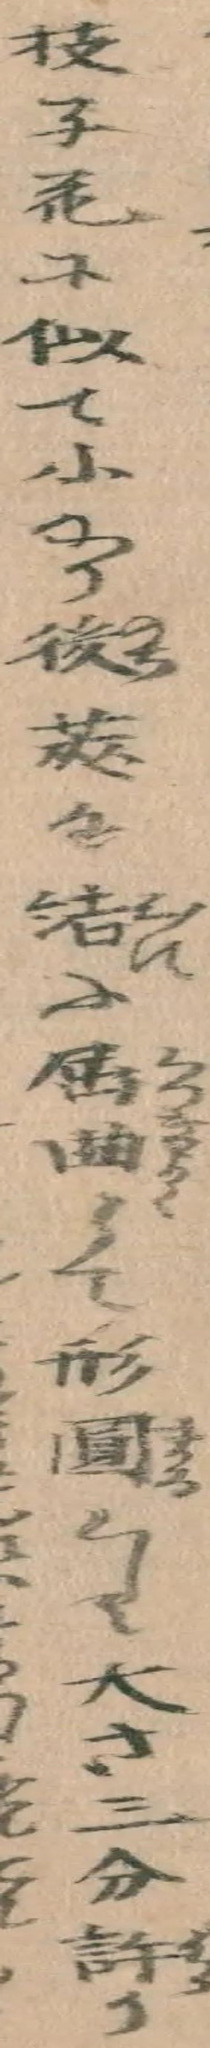枝子花に似て小なり後莢を結ふ屈曲して形円くして大さ三分許り

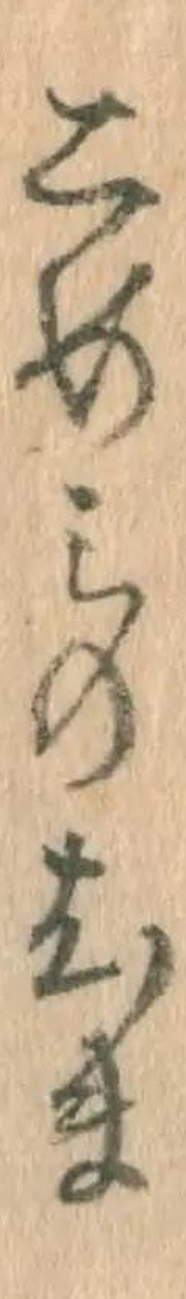こめみのむま
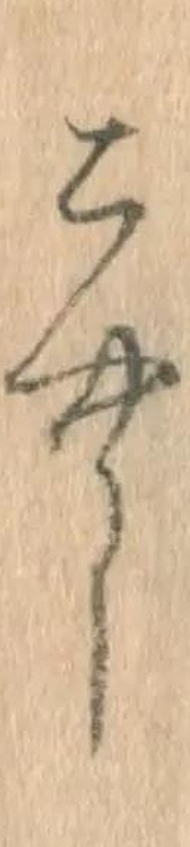こやし
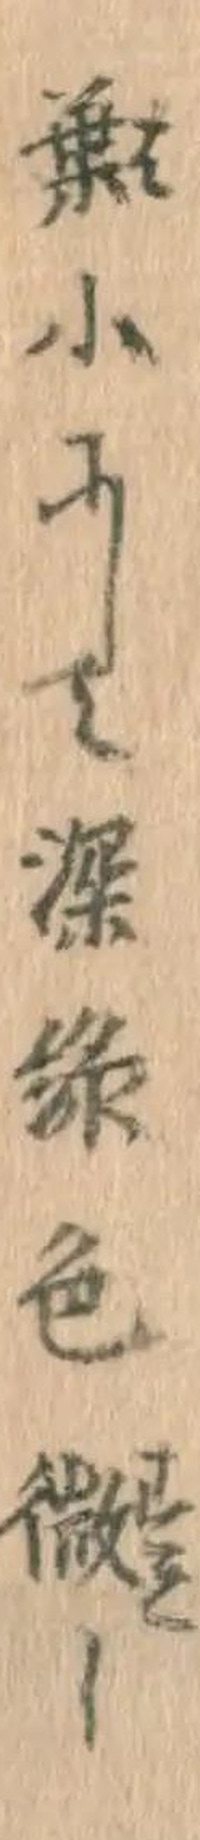葉小にして深緑色微し
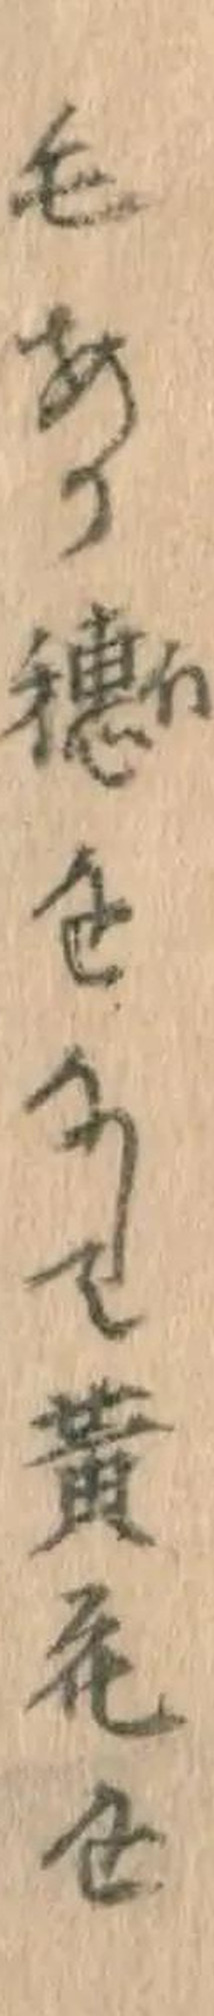毛あり穂をなして黄花を
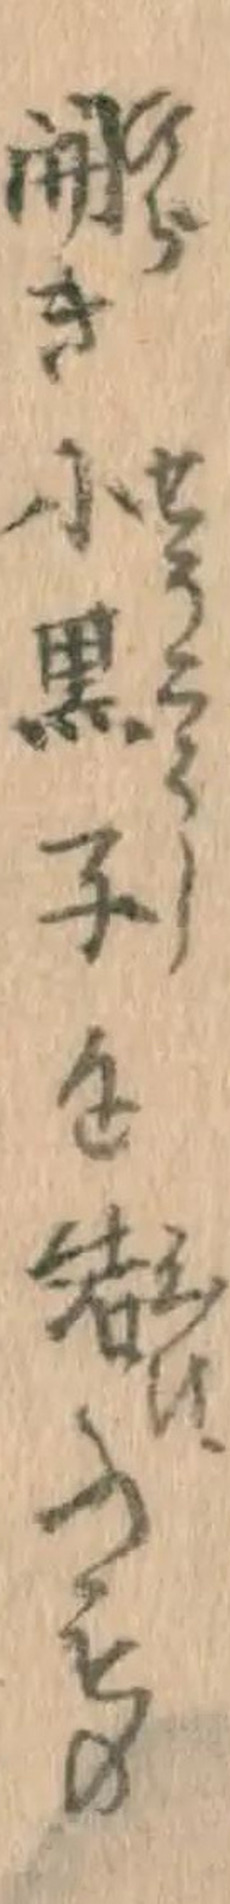開き小黒子を結ふもの
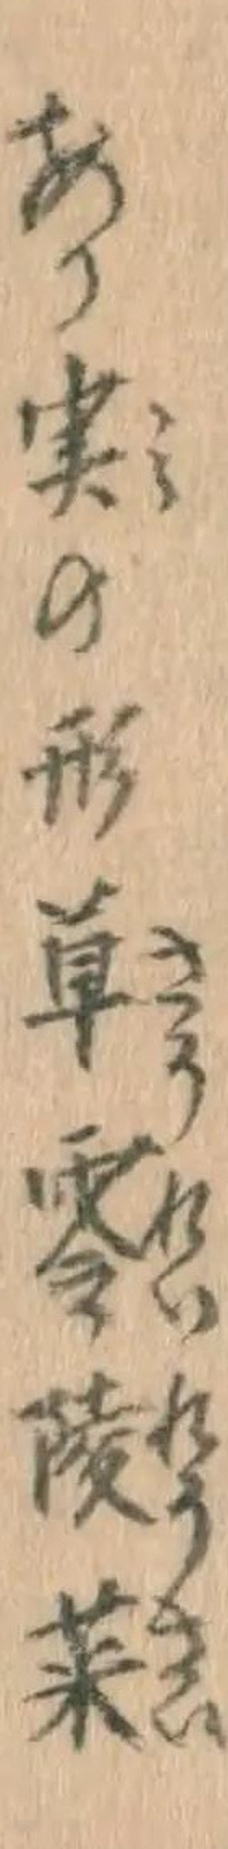あり実の形草零陵菜
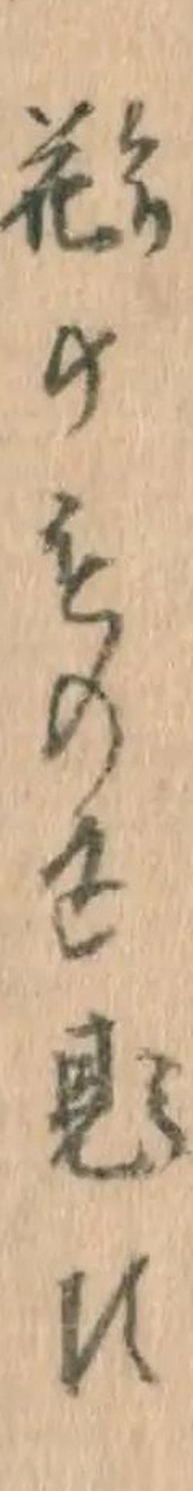花のものを見す
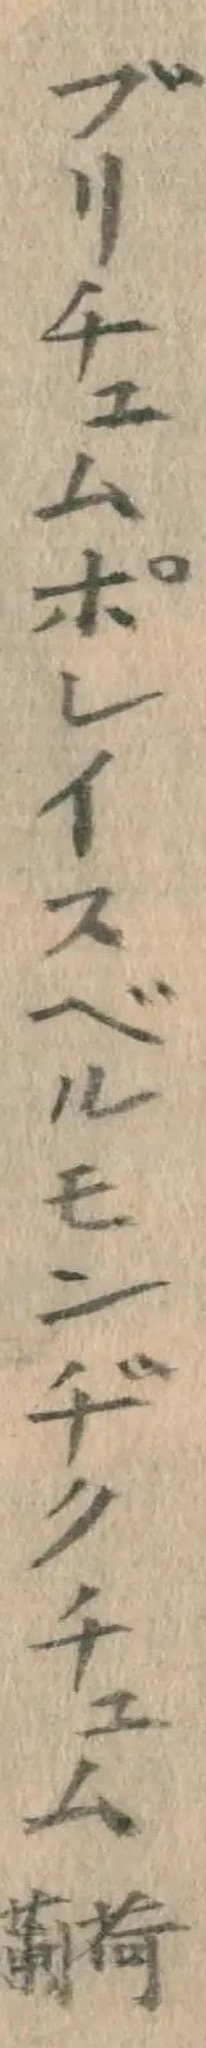ブリチュムポレイスベルモンヂクチュム荷蘭
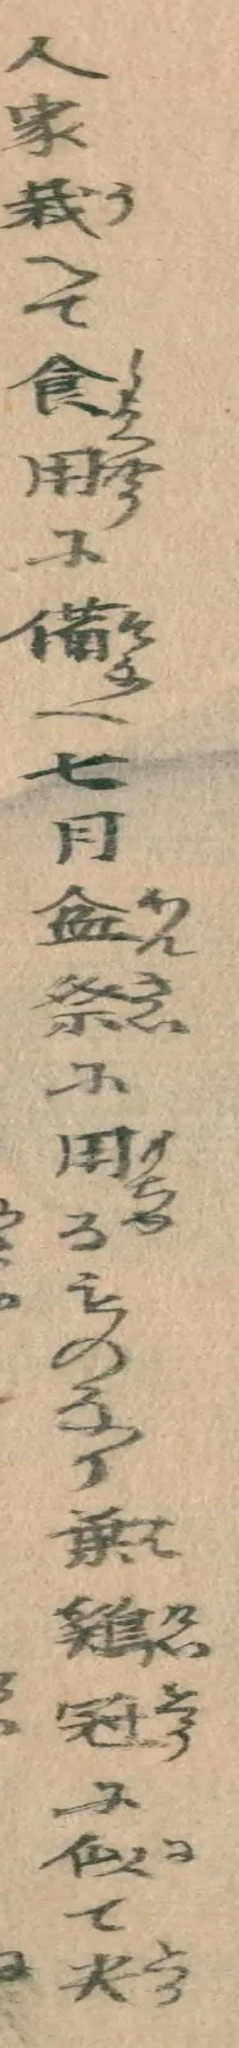人家栽へて食用に備へ七月盆祭に用るものなり葉鶏冠に似て尖
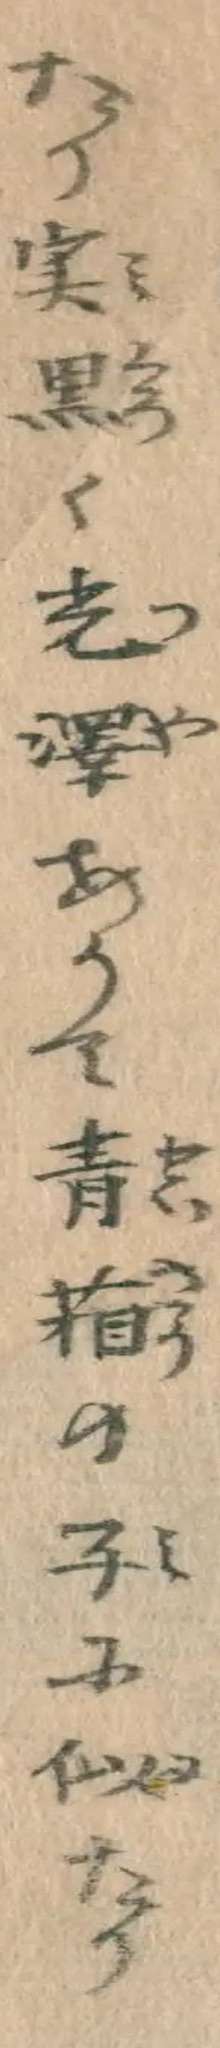たり実黒く光沢ありて青葙の子に似たり

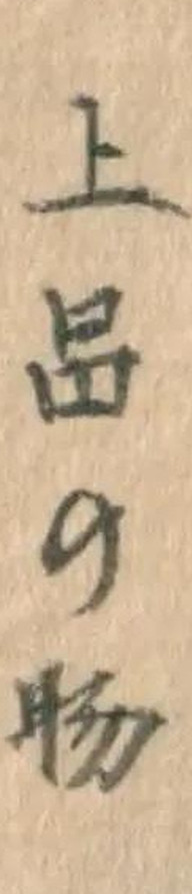上品の物
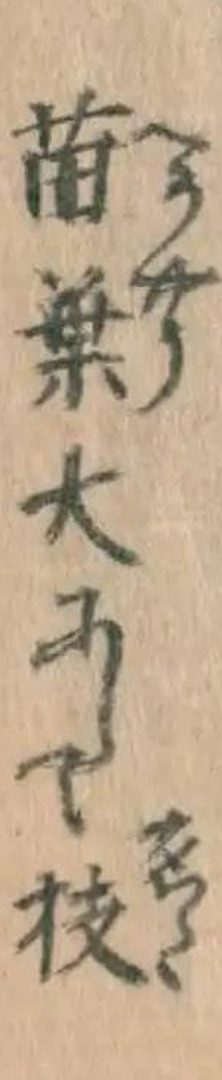苗葉大にして枝
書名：本草図譜. 巻46-48
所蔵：国立国会図書館 National Diet Library, JAPAN
